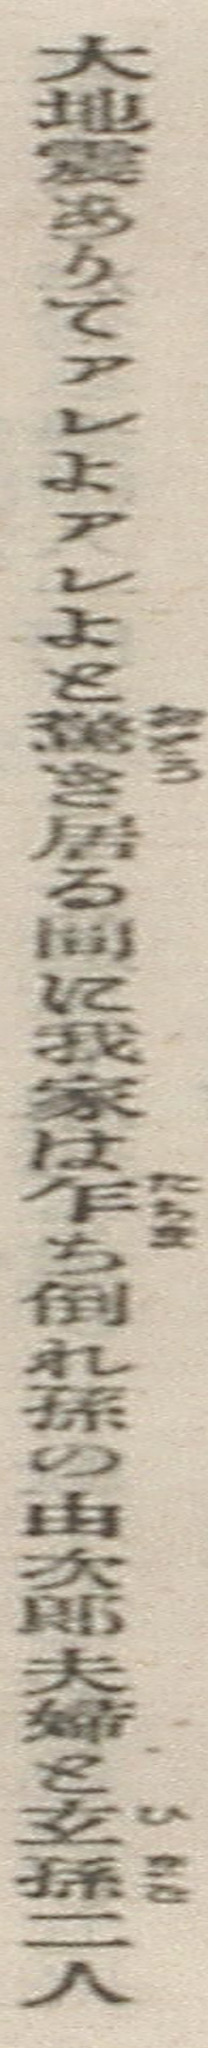大地震ありてアレよアレよと驚き居る間に我家は乍ち倒れ孫の由次郎夫婦と玄孫二人
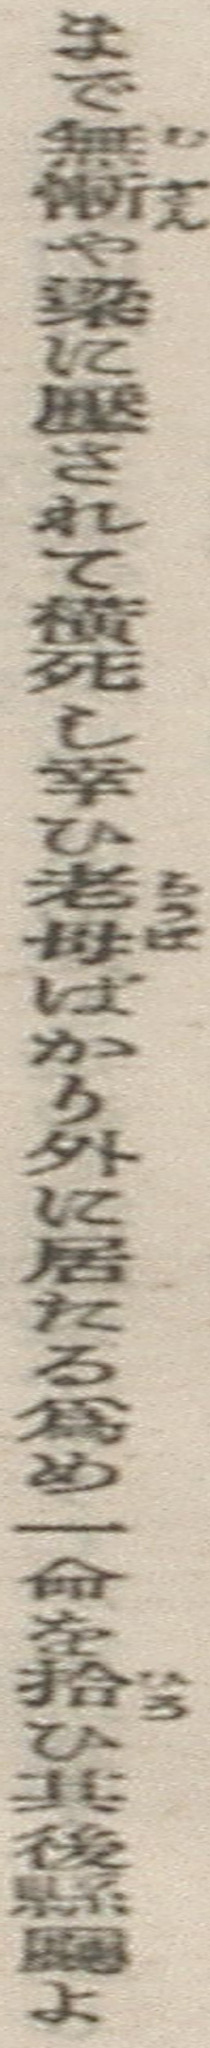まで無慚や梁に圧されて横死し幸ひ老母ばかり外に居たる為め一命を拾ひ其後県庁よ
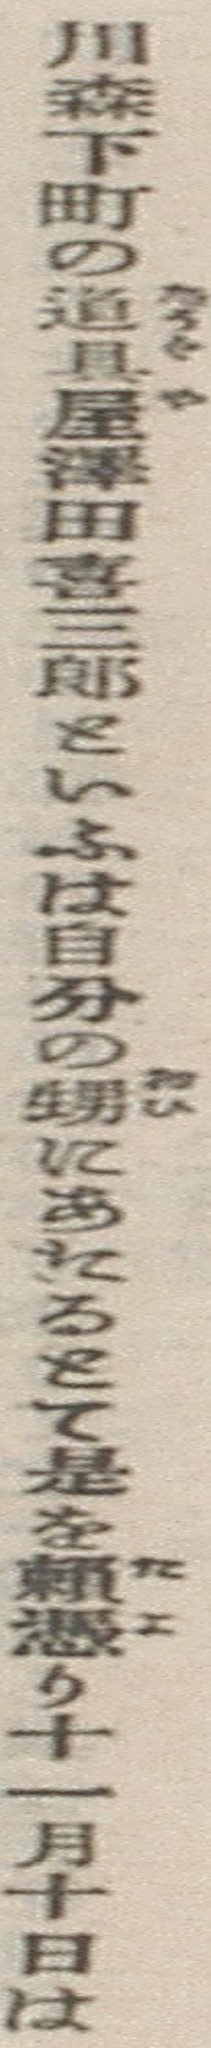川森下町の道具屋だうぐや澤田喜三郎といふは自分の甥にあたるとて是を頼憑り十一月十日は
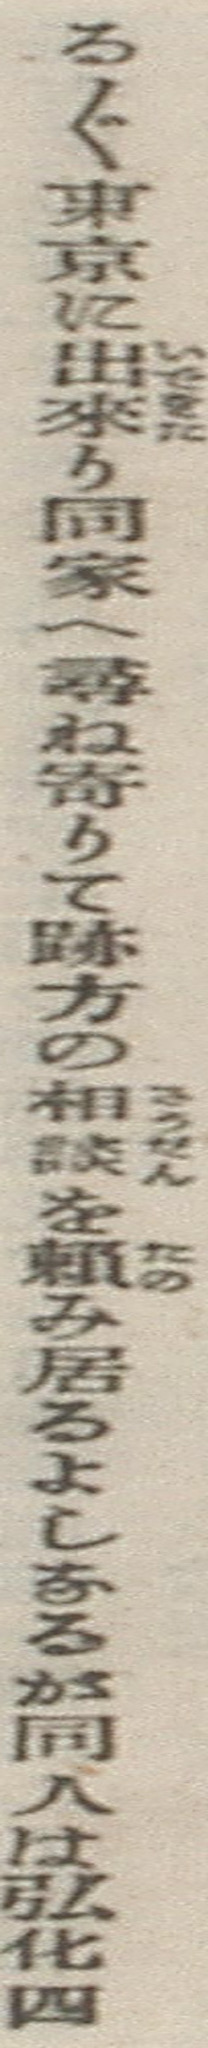る〴〵東京に出来り同家へ尋ね寄りて跡方の相談を頼み居るよしなるが同人は弘化四
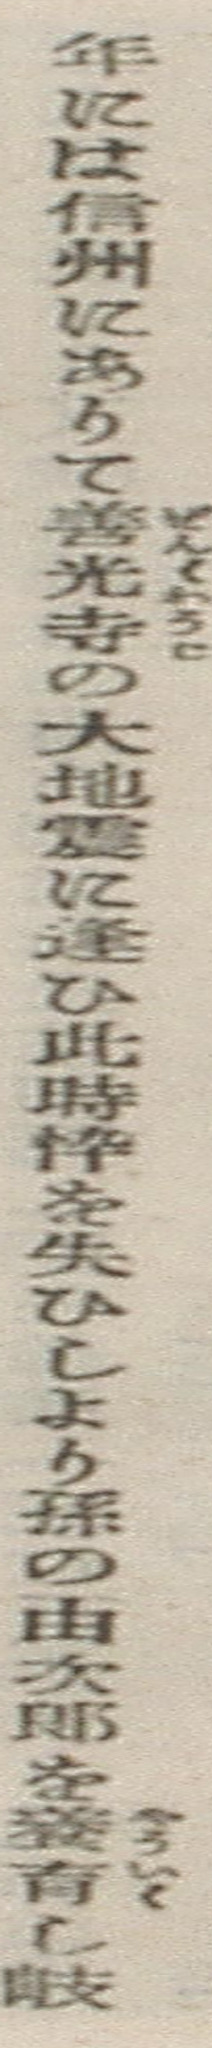年には信州にありて善光寺の大地震に逢ひ此時悴を失ひしより孫の由次郎を養育し岐
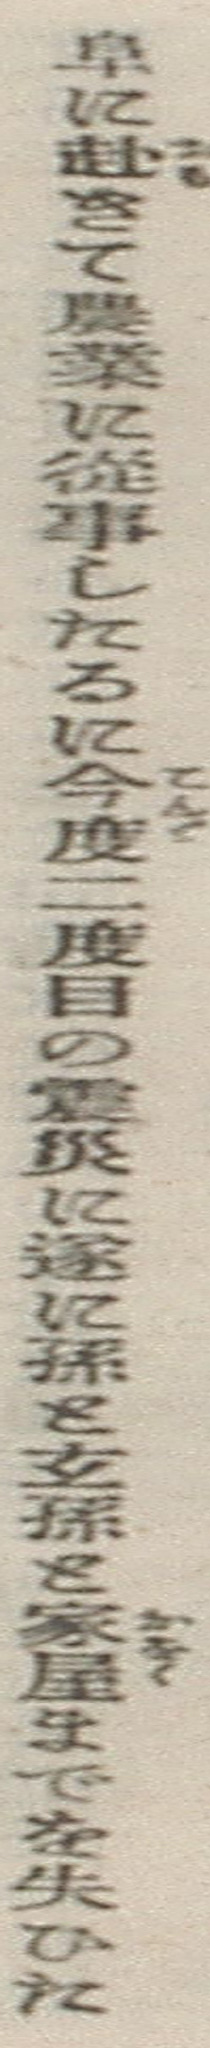阜に赴きて農業に従事したるに今度こんど二度目の震災に遂に孫と玄孫と家屋までを失ひた
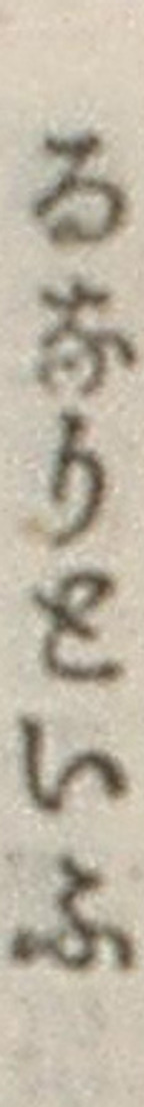りなりといふ
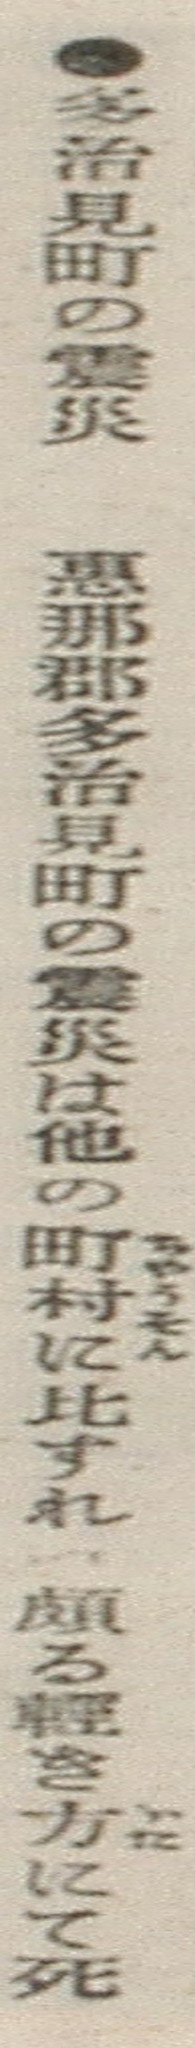●多治見町の震災恵那郡多治見町の震災は他の町村に比すれ頗る軽き方にて死
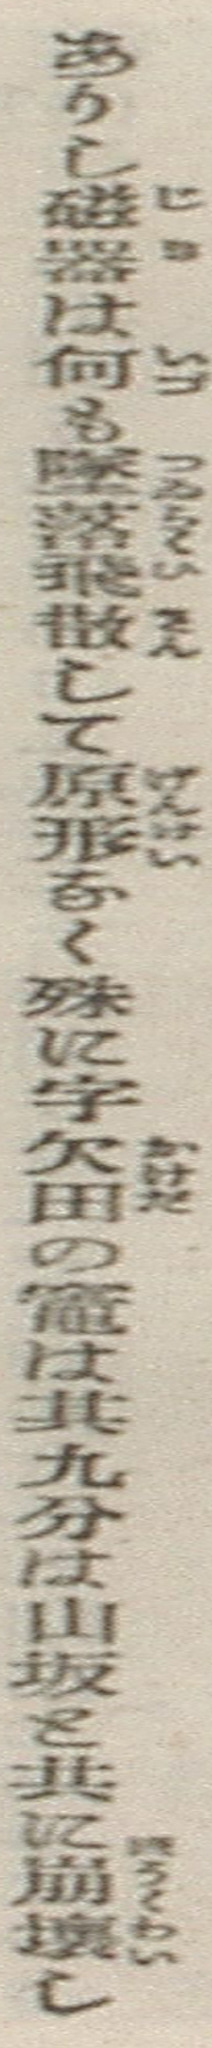ありし磁器は何も墜落飛散して原形なく殊に字欠田かけだの竈は其九分は山坂と共に崩壊し
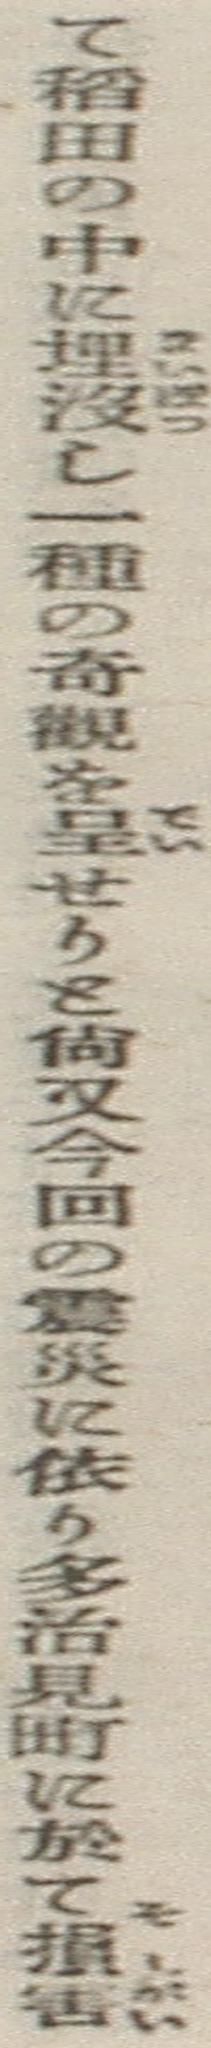て稲田の中に埋没し一種の奇観を呈せりと尚又今回の震災に依り多治見町に於て損害
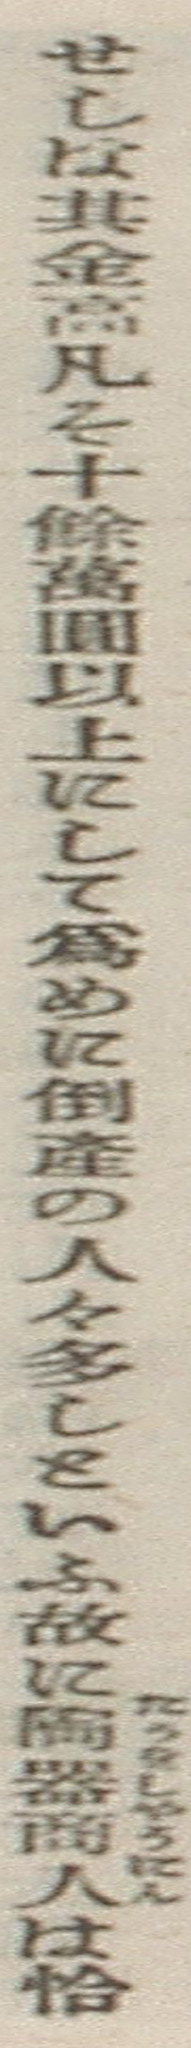せしは其金高凡そ十余万円以上にして為めに倒産の人々多しといふ故に陶器商人は恰
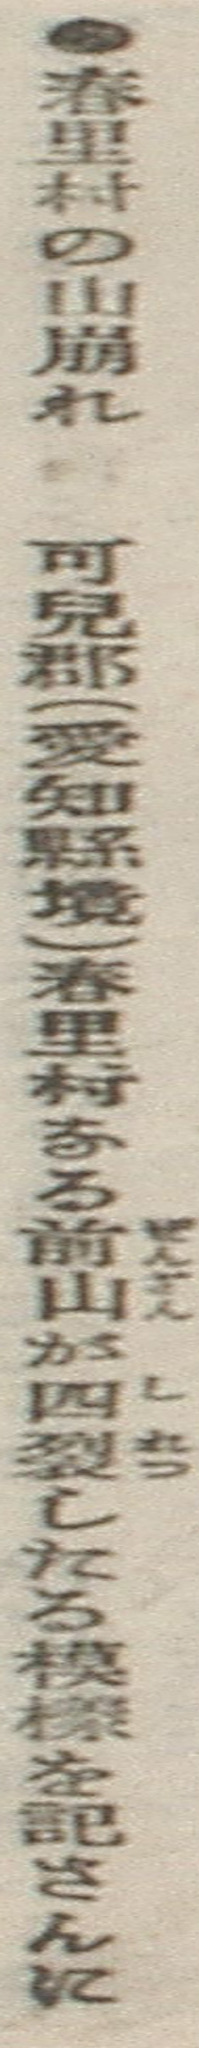●春里村の山崩れ可児郡春里村なる前山が四裂したる模様を記さんに

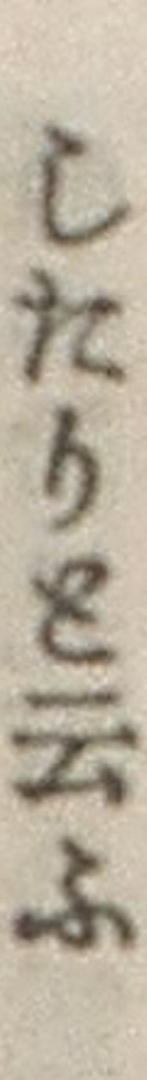したりと云ふ
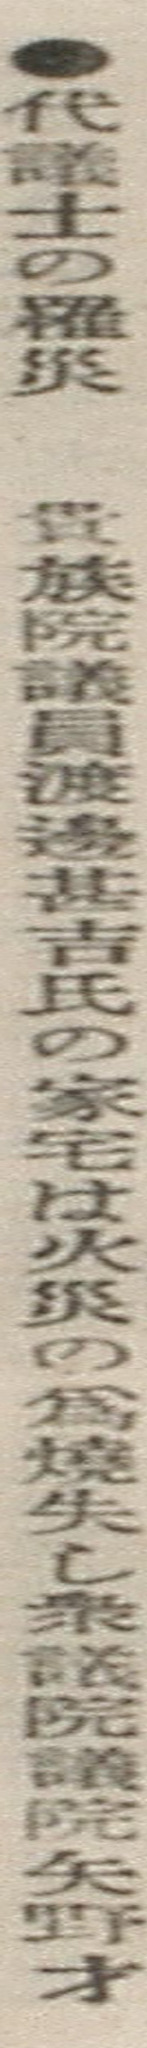●代議士の罹災貴族院議員渡邊甚吉氏の家宅は火災くわさいの為消失し衆議院議員矢野才

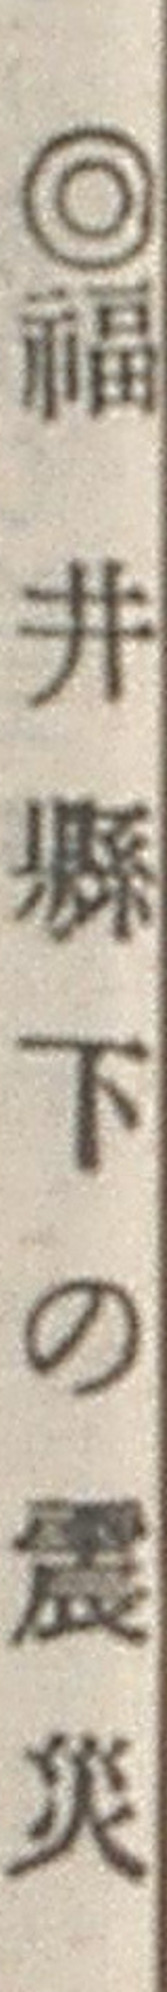◎福井縣下の震災
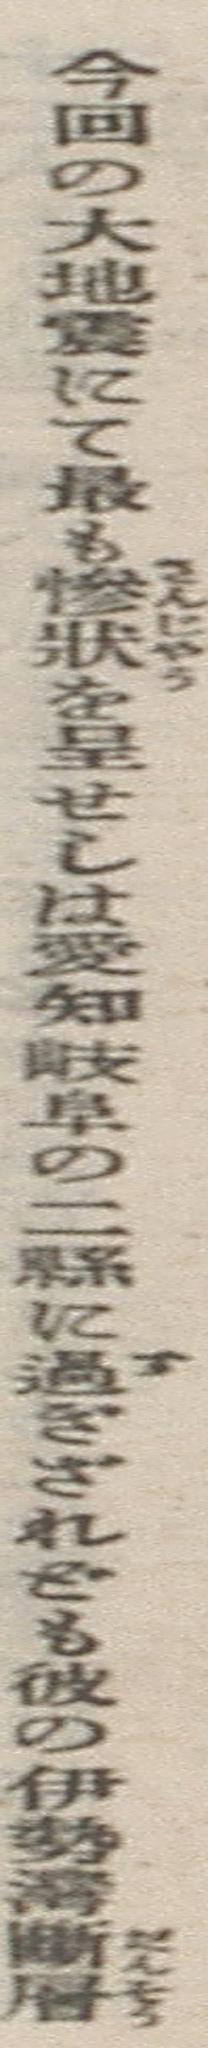今回の大地震にて最も惨状を呈せしは愛知岐阜の二縣に過ぎざれども彼の伊勢湾断層
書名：愛知岐阜福井三県　大地震見聞録（内題）
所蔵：東京大学地震研究所図書室 Earthquake Research Institute Library, The University of Tokyo, JAPAN
